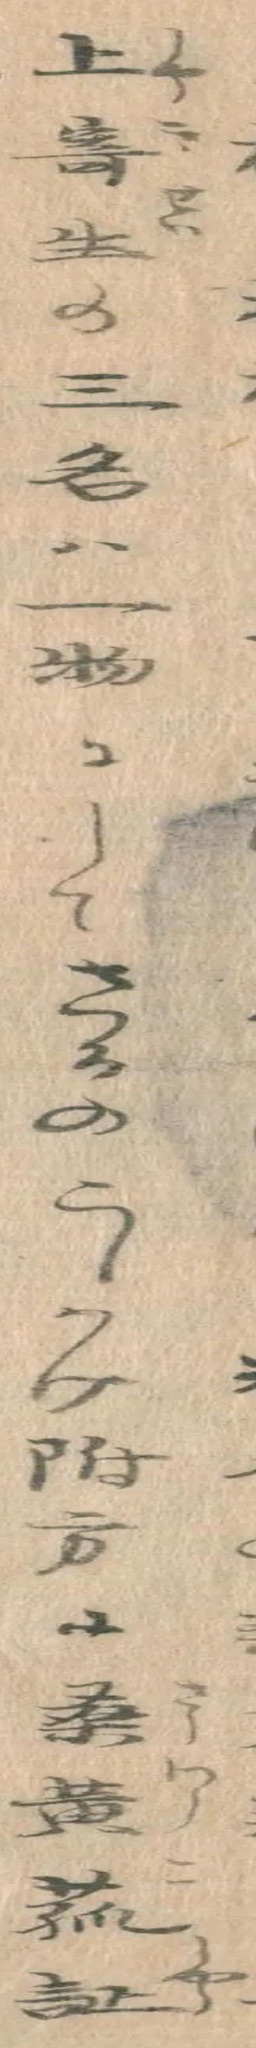上寄生の三名は一物にしてさるのこしかけ附方に桑黄菰証
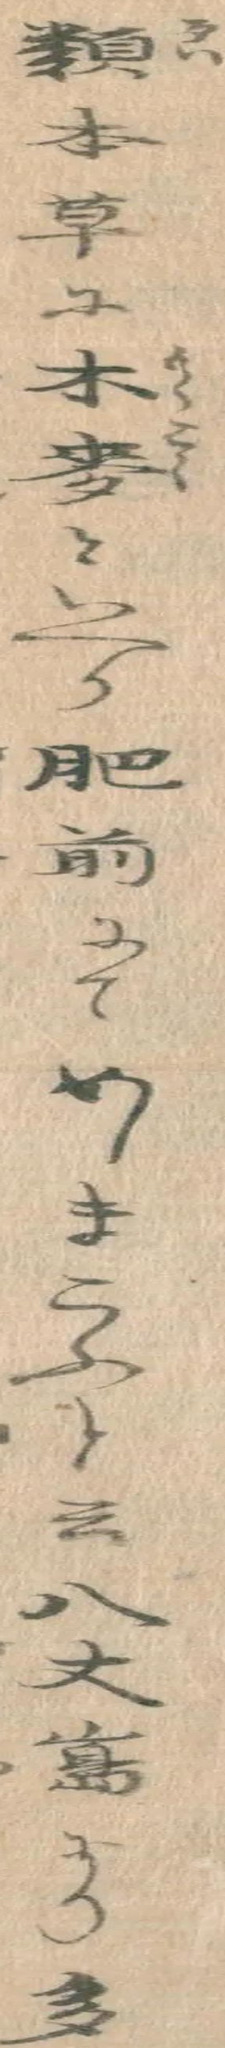類本草に木麦といへり肥前にてめしまこふと云八丈島より多
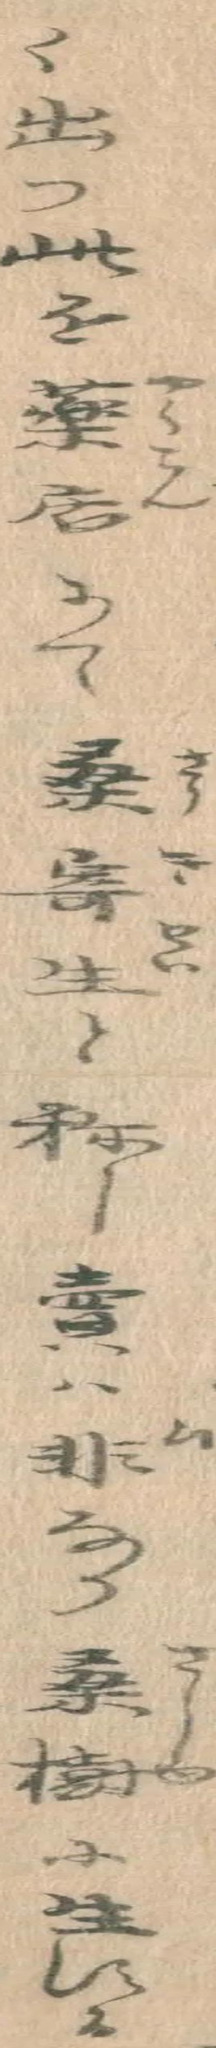く出つ此を薬店にて桑寄生と称し売は非なり桑樹に生する
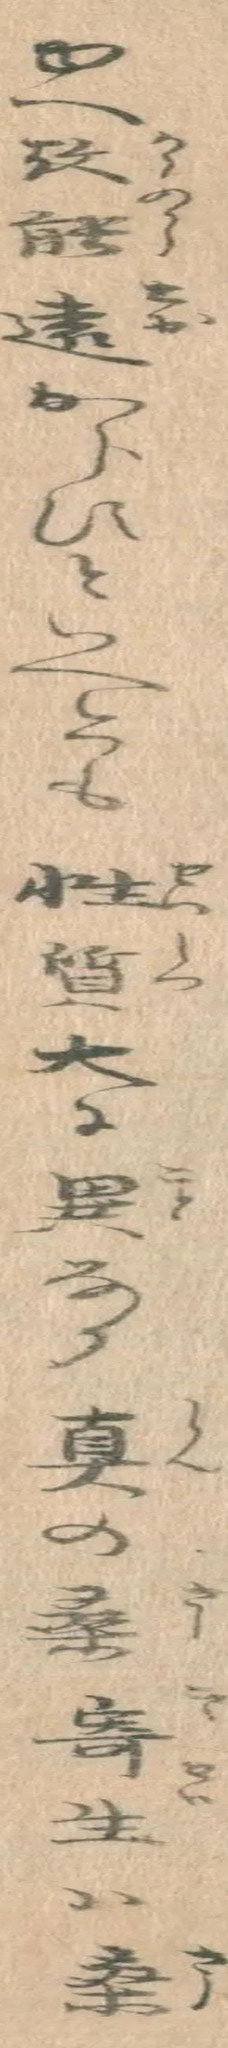ゆへ攷能遠からすといへとも性質大に異なり真の桑寄生は桑
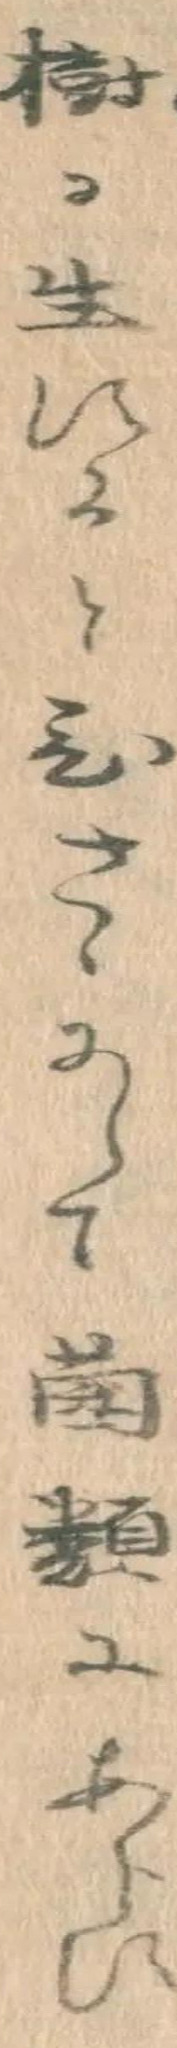樹に生するとひさゝにして菌類にあらす

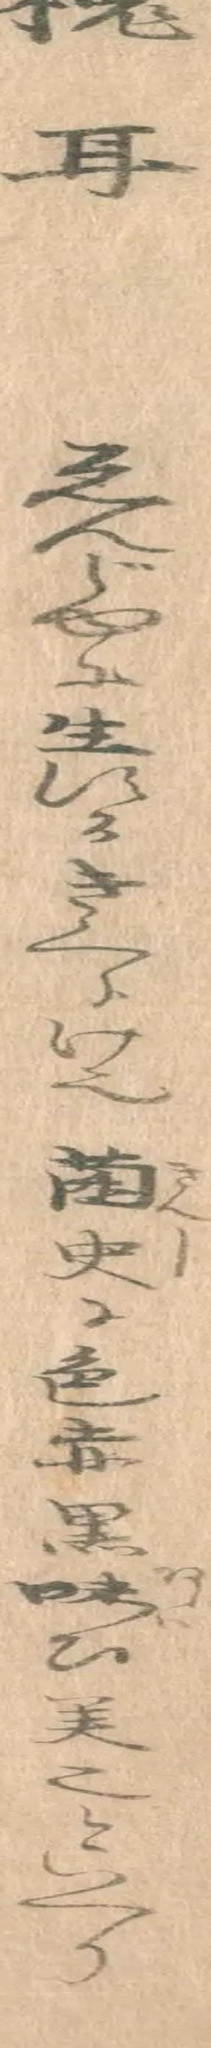槐耳ゑんじゆに生するきくらけ也菌史に色赤黒味ひ美也といへり
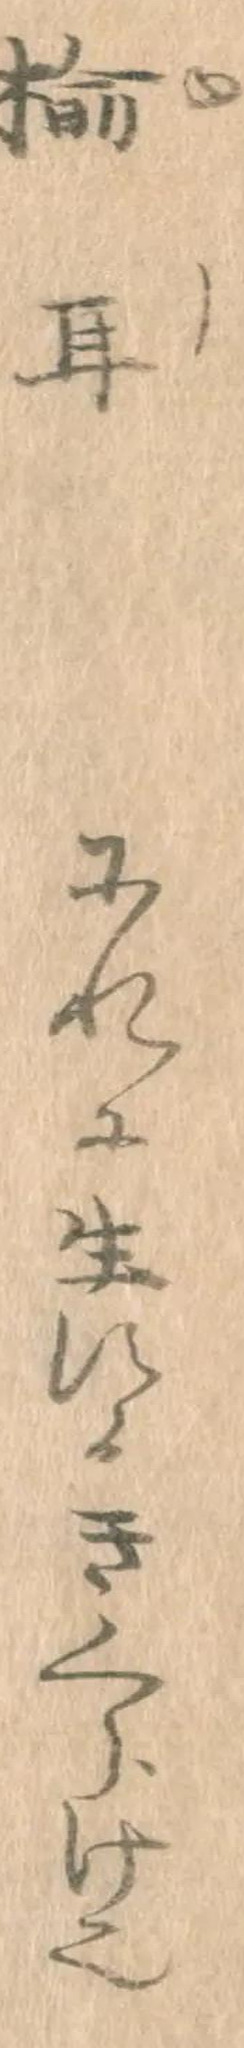楡耳にれに生するきくらけ也
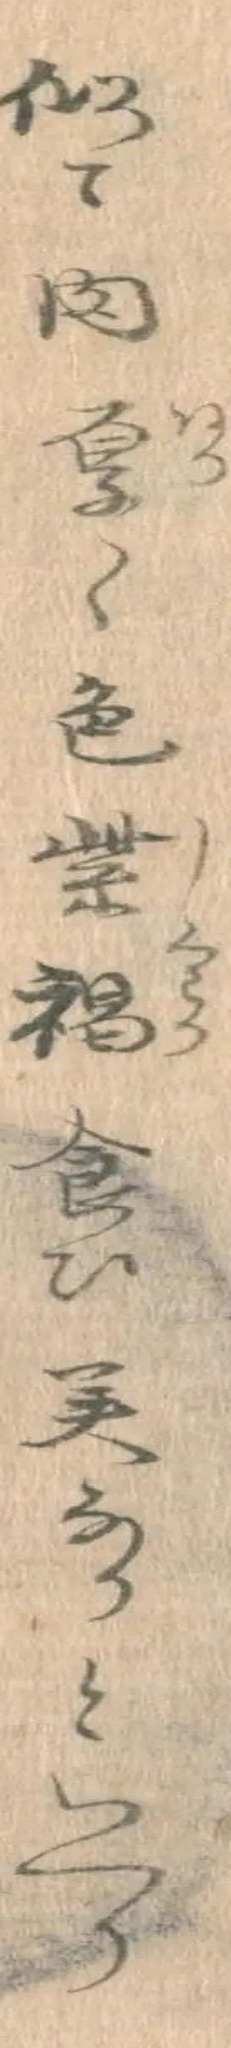似て肉厚く色紫褐食ひ美なりといへり
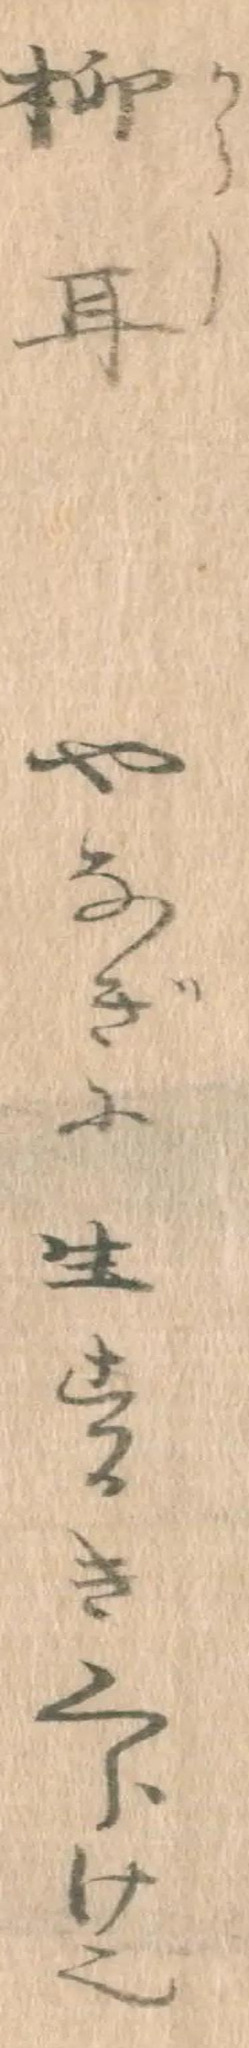柳耳やなぎに生するきくらけ也
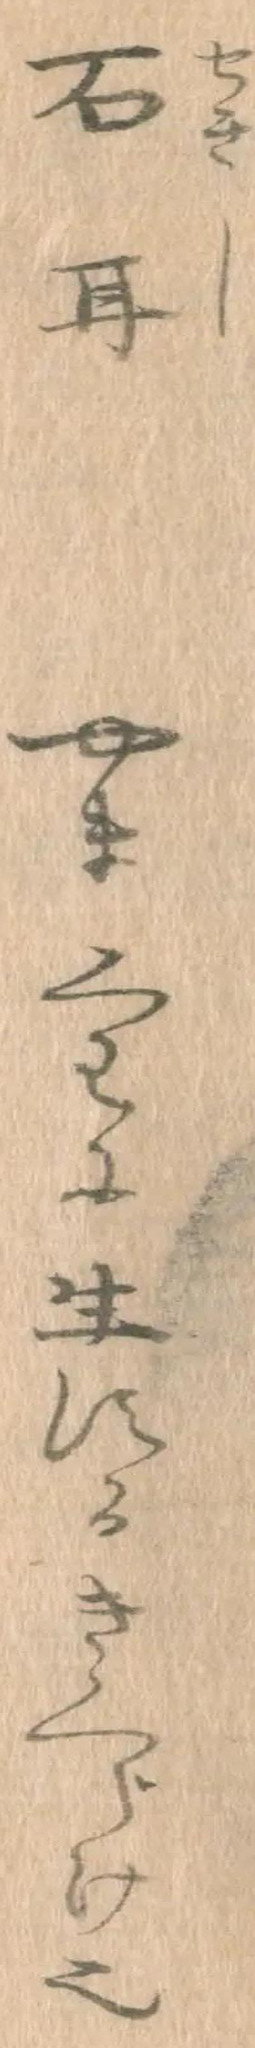石耳やまくわに生するきくらけ也
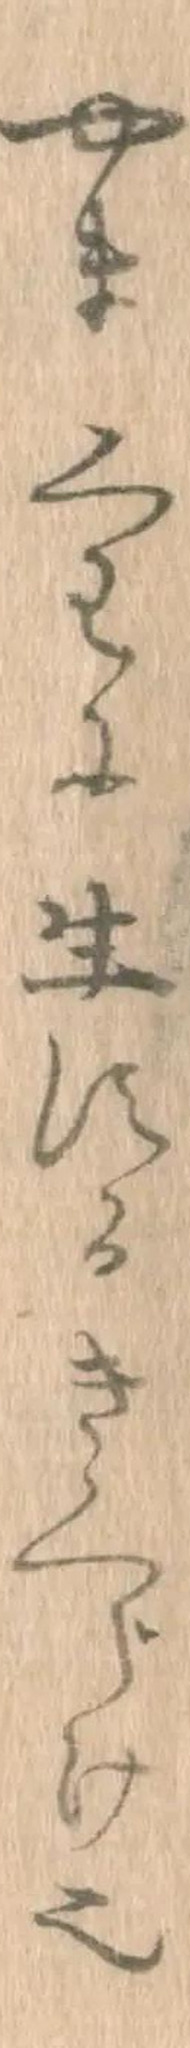石耳やまくわに生するきくらけ也
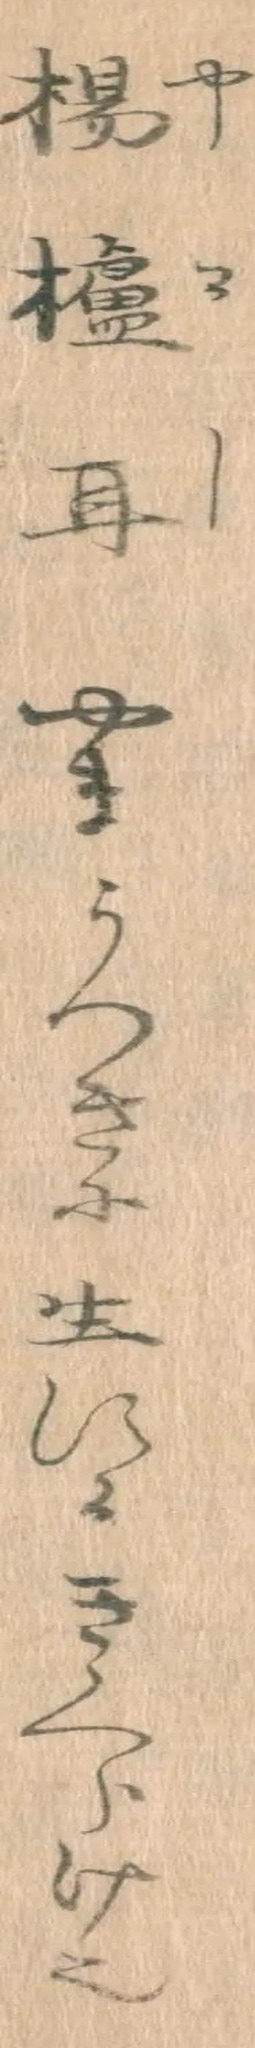楊櫨耳やまうつきに生するきくらけ也
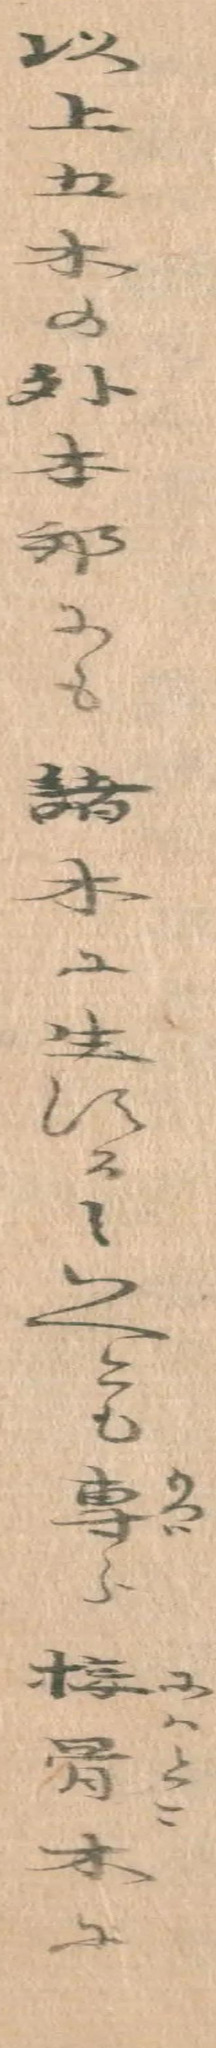以上五木の外本邦にも諸木に生するといへとも専ら接骨木に
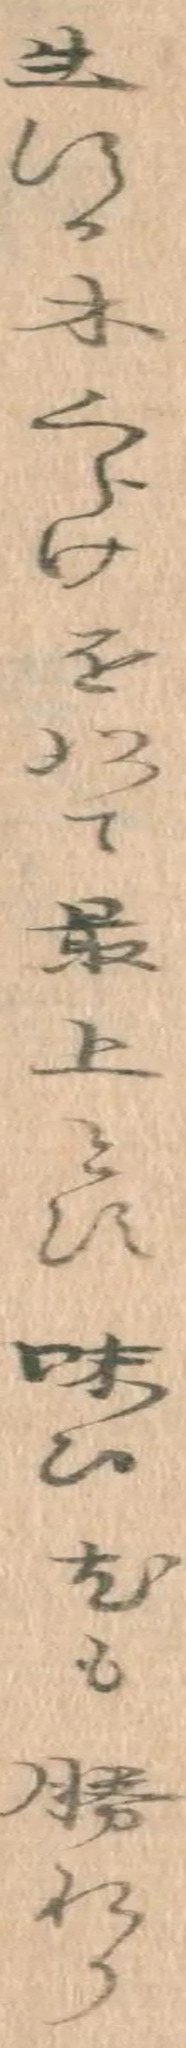生する木くらけを以て最上とす味ひ尤も勝れり
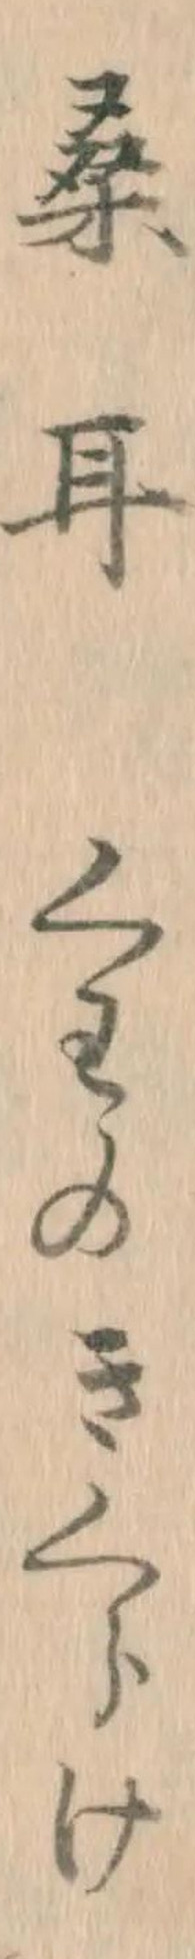桑耳くわのきくらけ
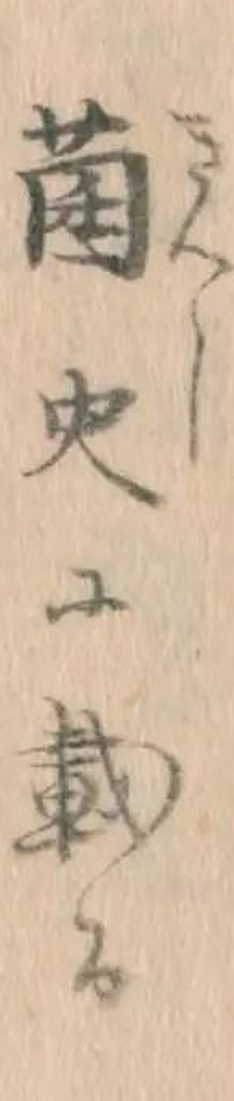菌史に載る
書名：本草図譜. 巻55-57
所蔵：国立国会図書館 National Diet Library, JAPAN
